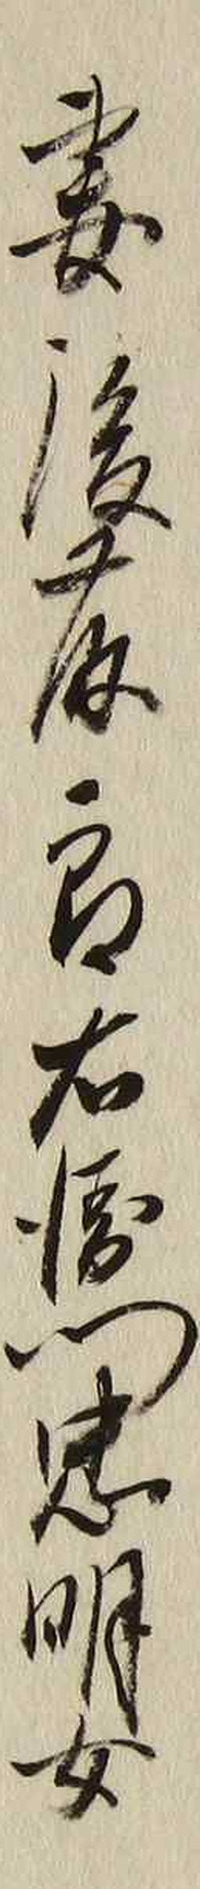妻後藤郎右衛門忠明女

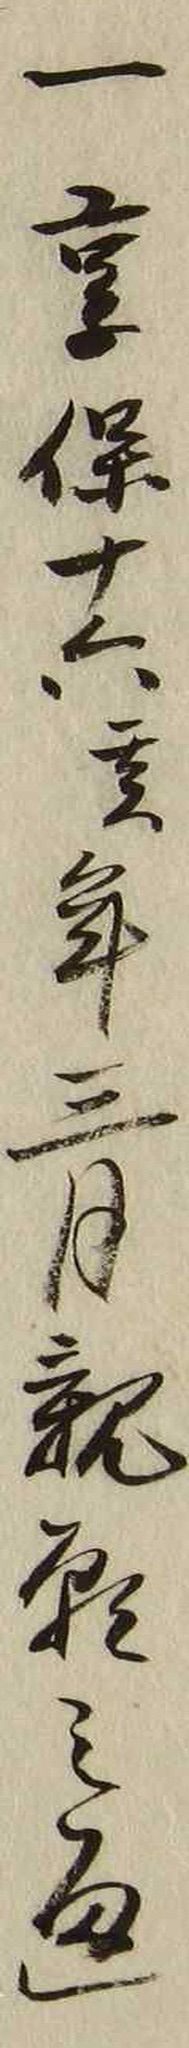一享保十六亥年三月親願之通
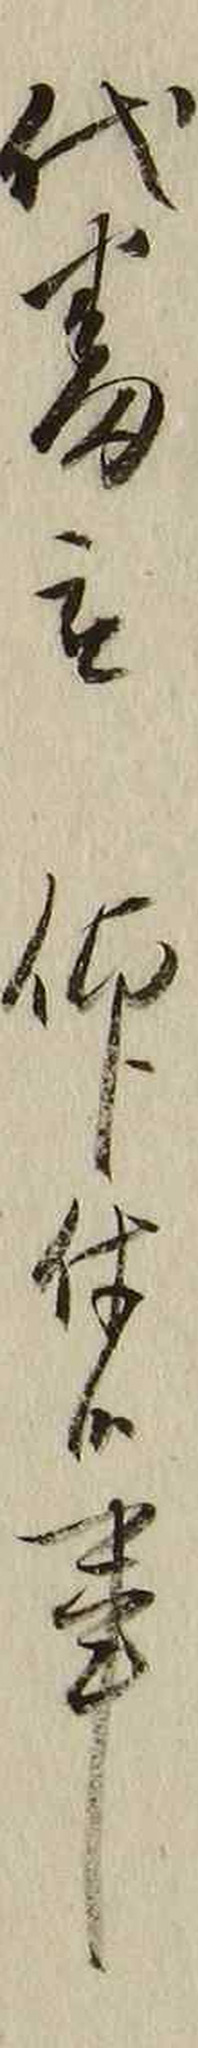代番被仰付候事
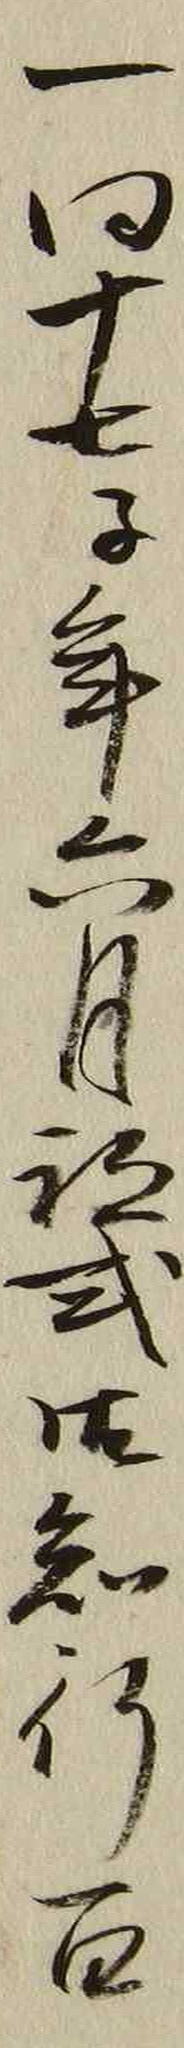一同十七子年六月跡式御知行百
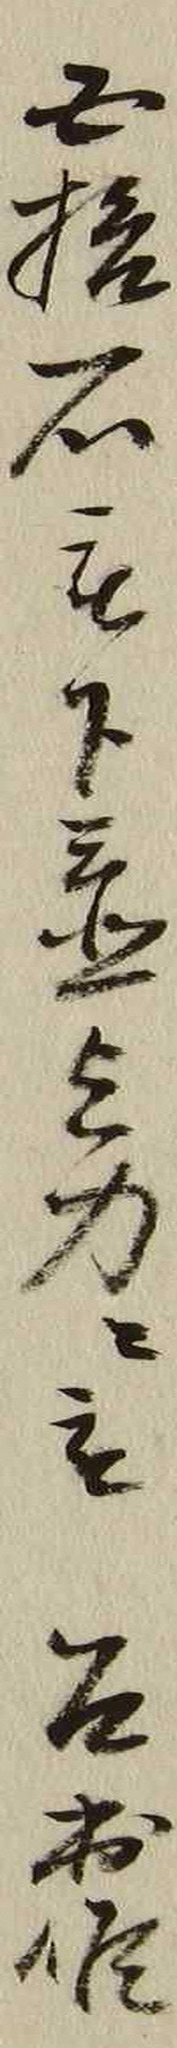五拾石被下置与力被召出候
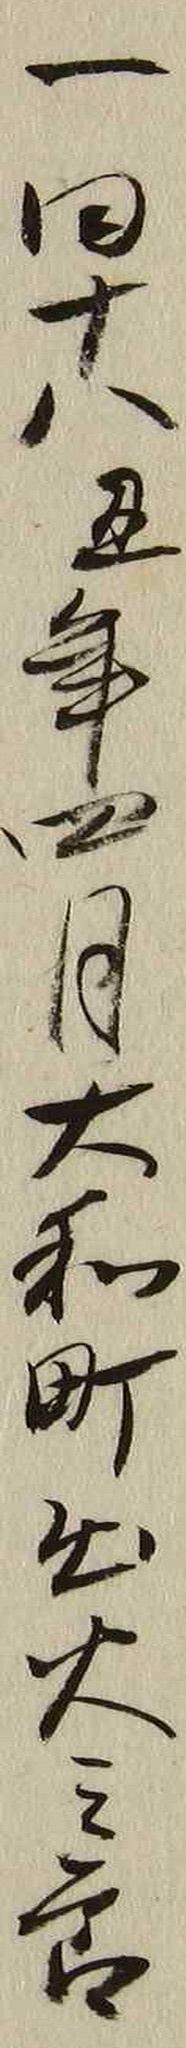一同十八丑年四月大和町出火之節
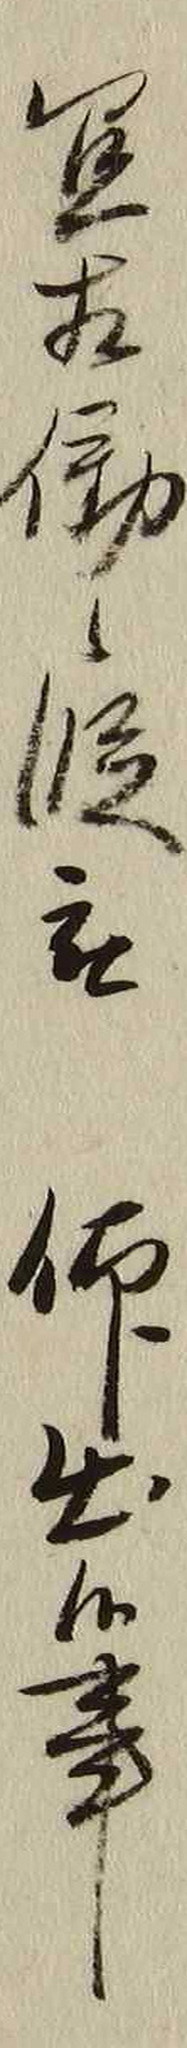宜相働候段被仰出候事
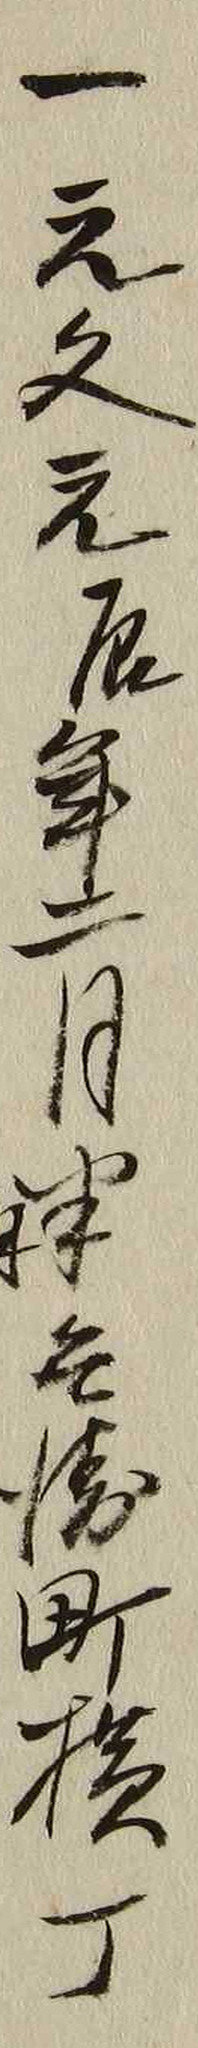一元文元辰年二月半兵衛町横丁
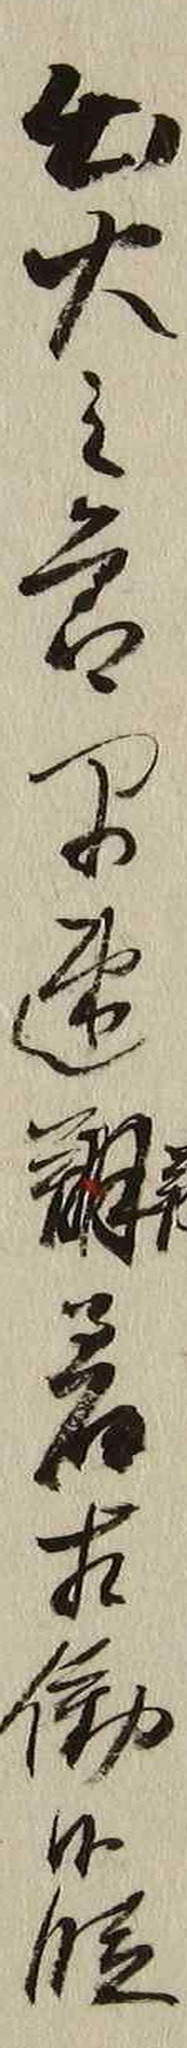出火之節早速朔着相働候段
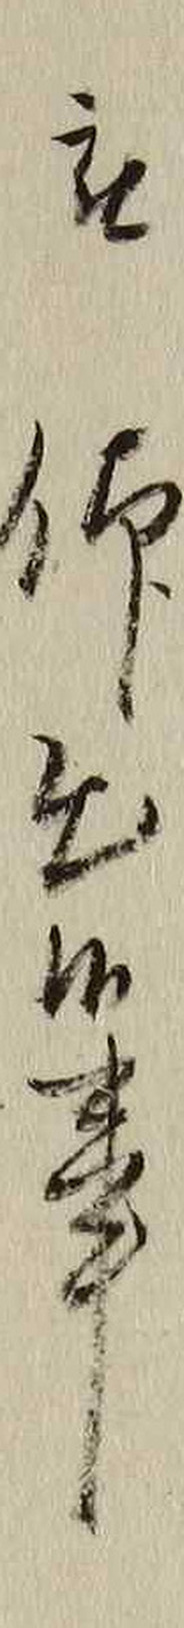被仰出候事
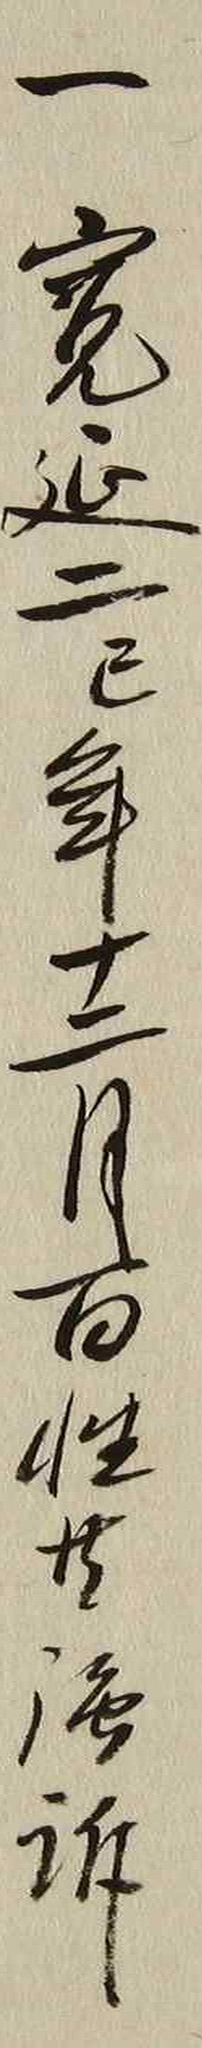一寛延二巳年十二月百性共強訴
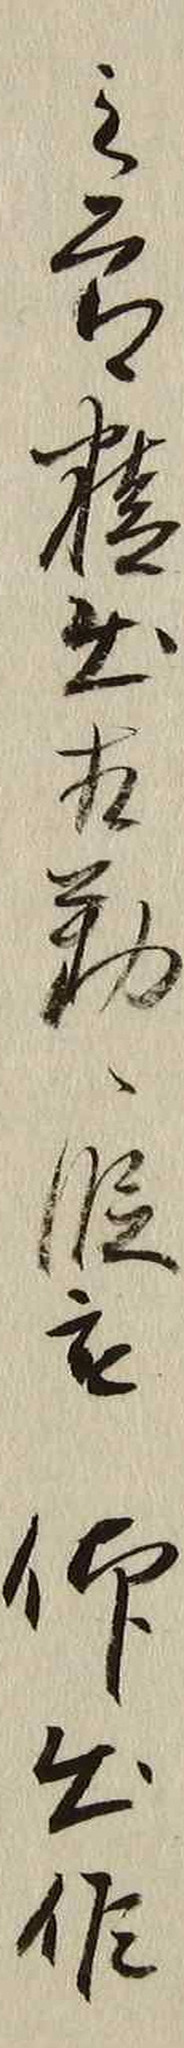之節精出相勤候段被仰出候
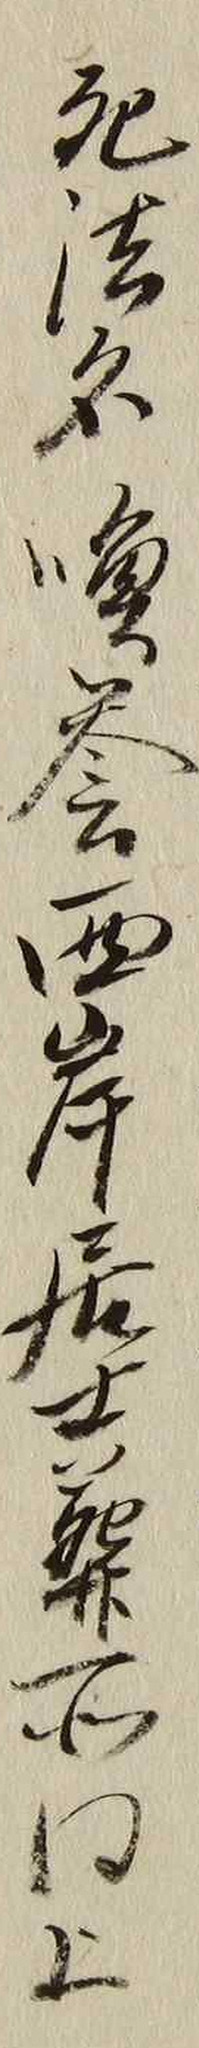死法名喚誉西岸居士葬所同上
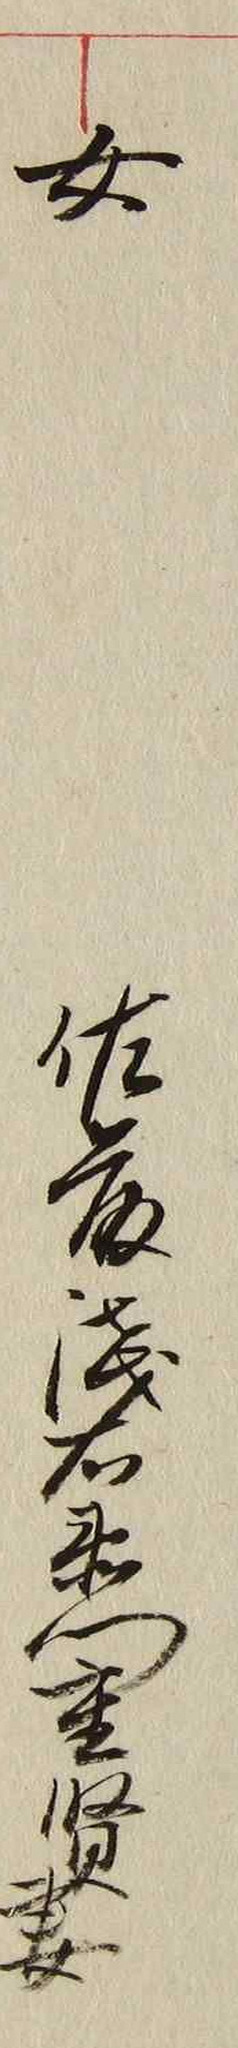女佐藤浅右衛門重賢妻
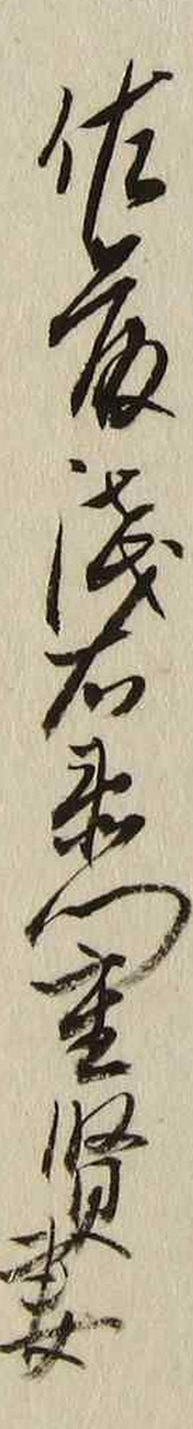女佐藤浅右衛門重賢妻
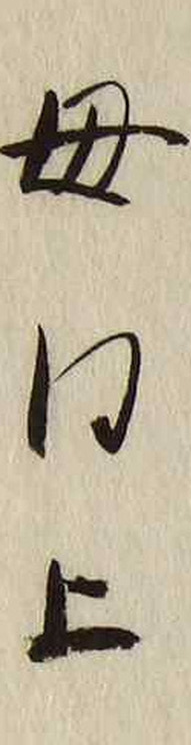母同上
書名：諸士系譜　巻之350　せ之部1冊全
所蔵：会津若松市立会津図書館
